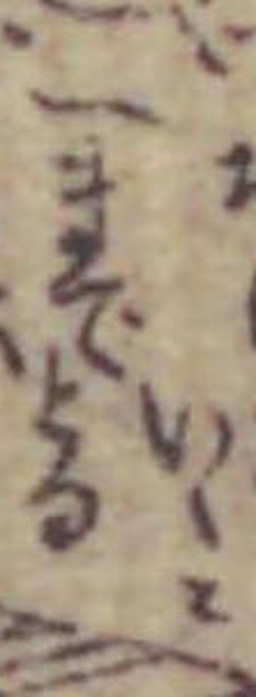一までとる
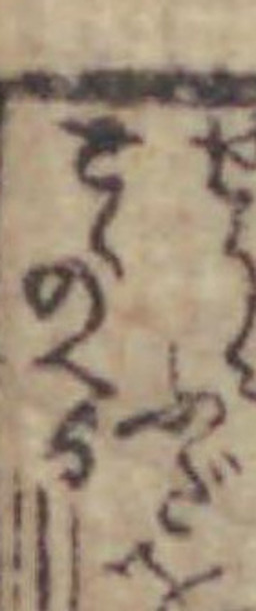とゝのへる
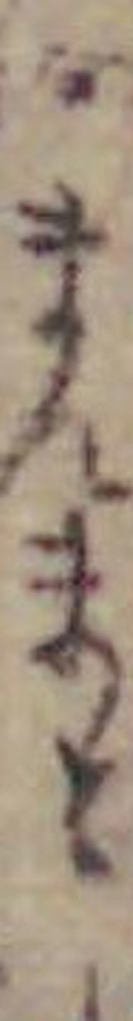まんまと
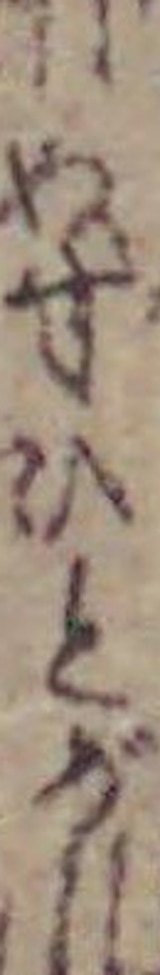ぬすひとが
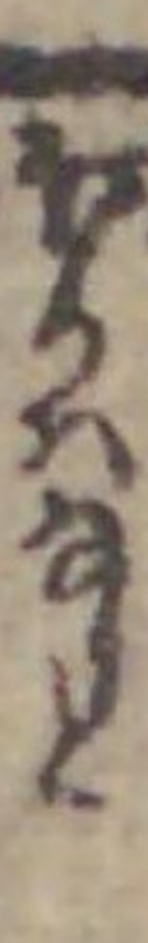ほかはなしと
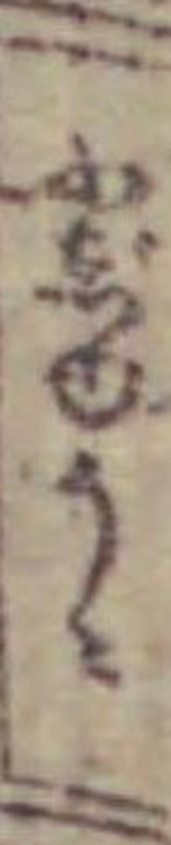ふじゆうに
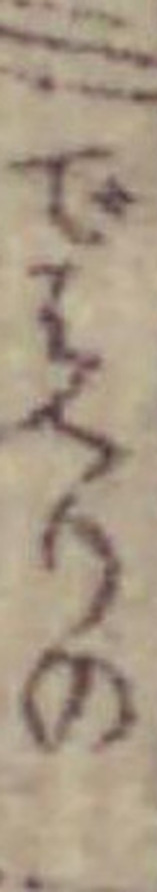ではえりの
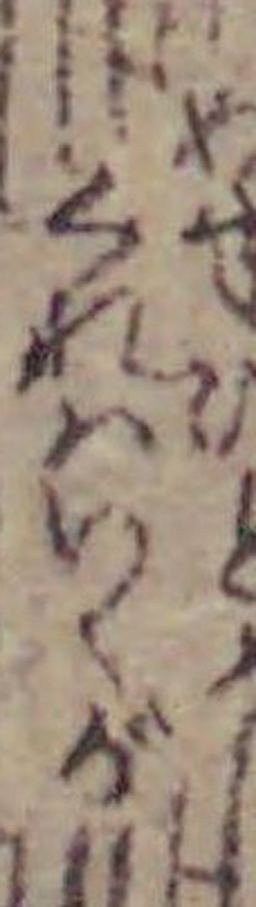くれはいゝが
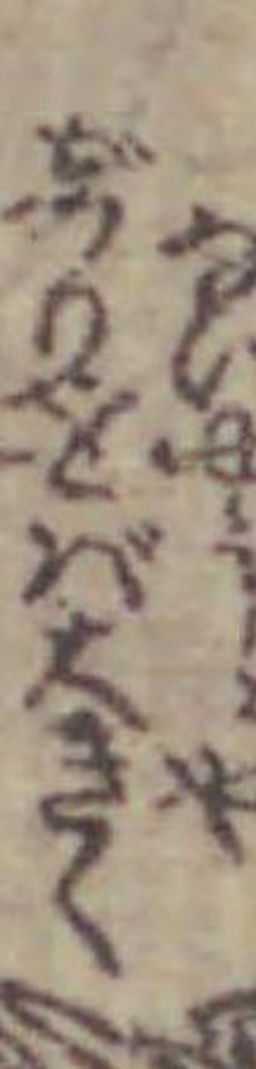じりをば大きく
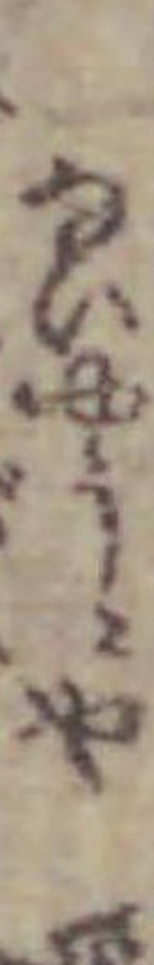ないやうにや
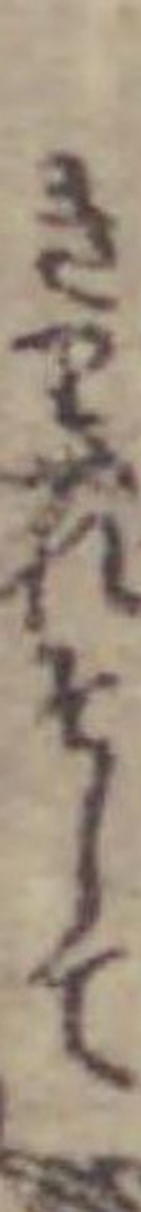きりやれそして
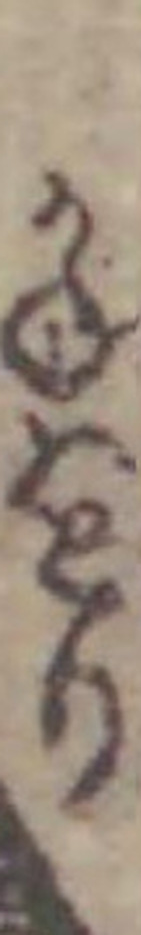かねはとり
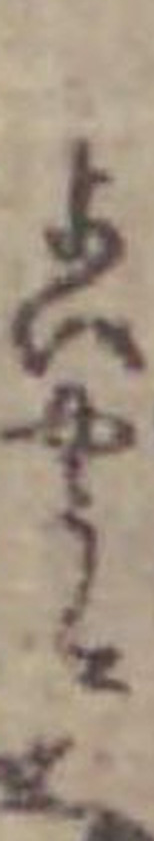よいやうに
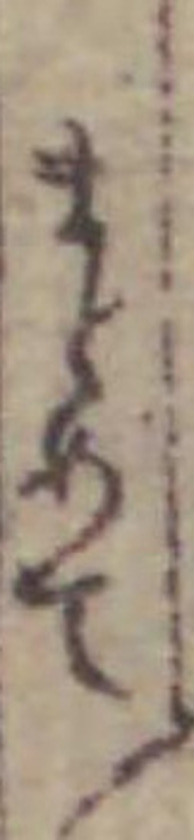まとめて
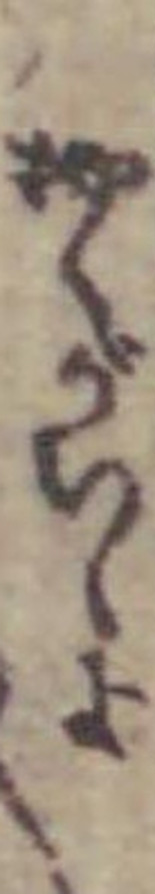おくがいゝよ
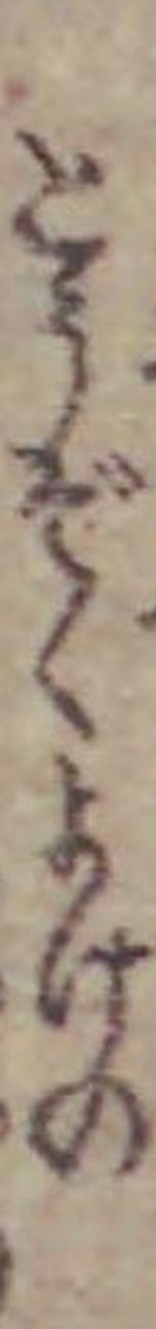とうぞくよけの
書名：莫切自根金生木 : 3巻
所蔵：国立国会図書館 National Diet Library, JAPAN
